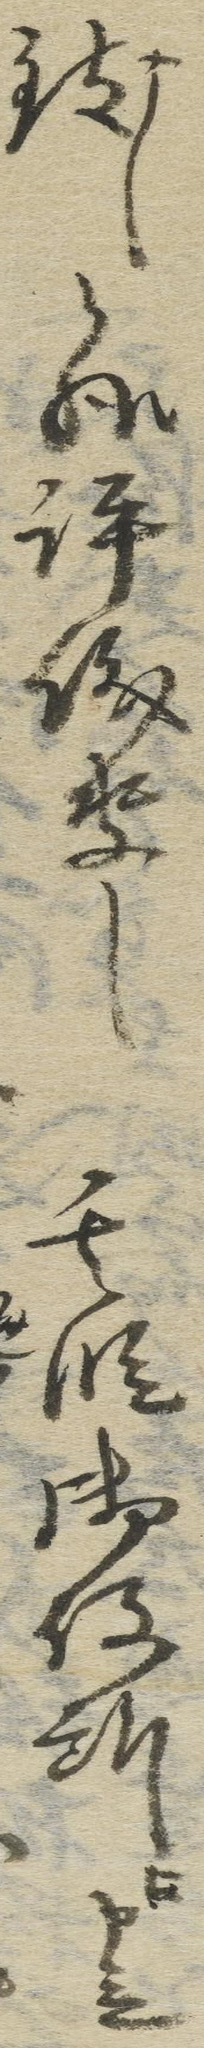致し候様評儀決し其段御役所江申立
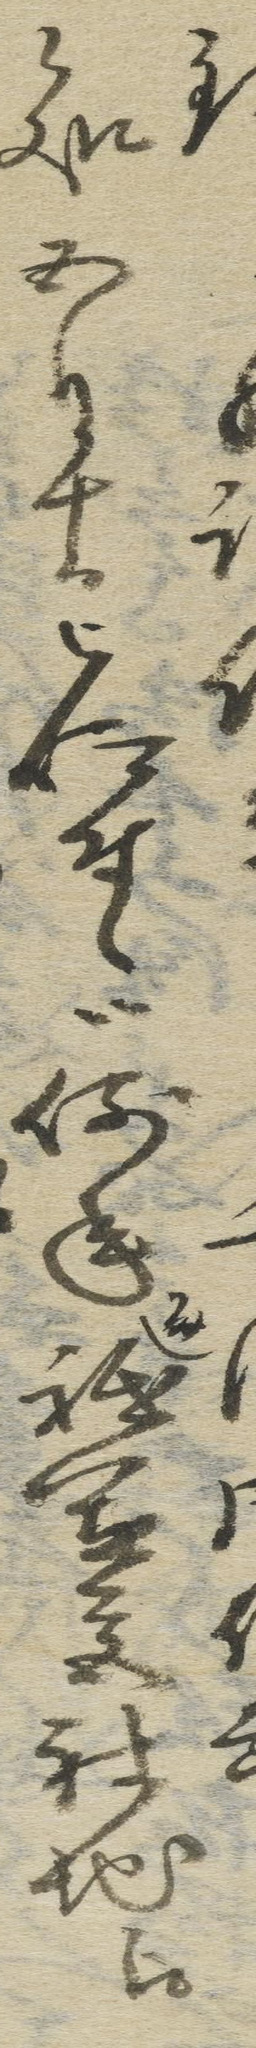候処五月十日被仰付候ハ例年通稲里宮社地江
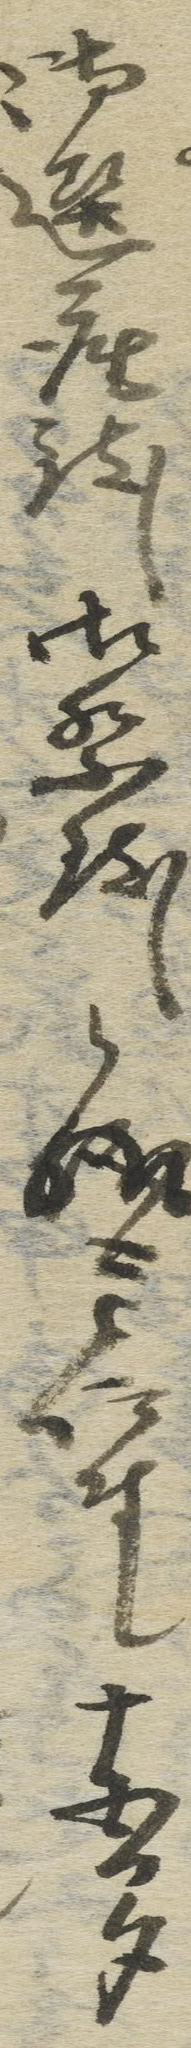御遷座致し御祭致し候儀二被仰付候十五日夕
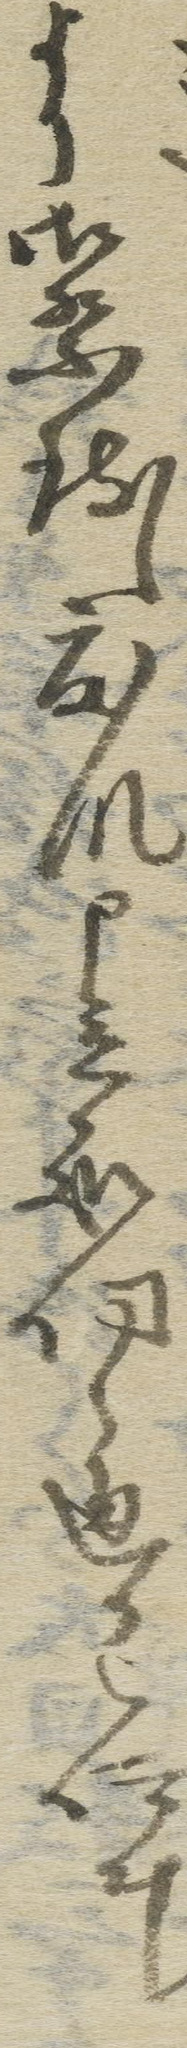より御祭致し度段申立候処伺之通り被仰付候
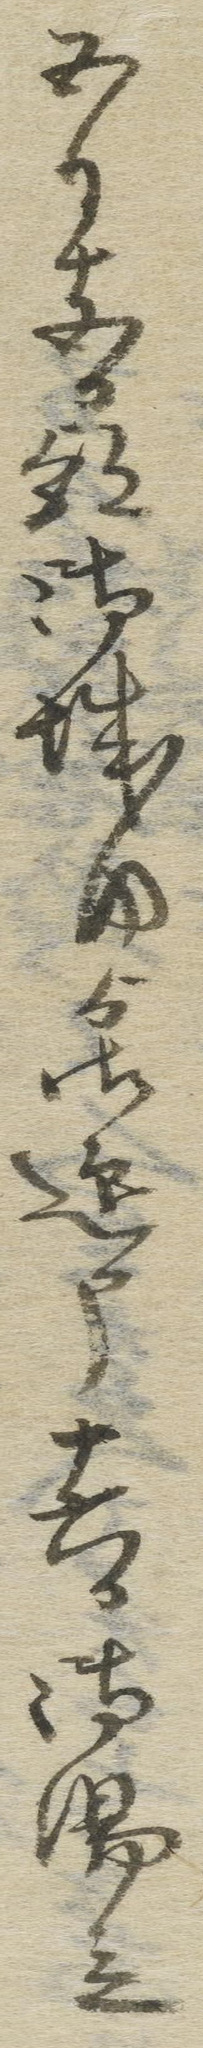五月十五日朝御城内ゟ御迎申十六日御湯立
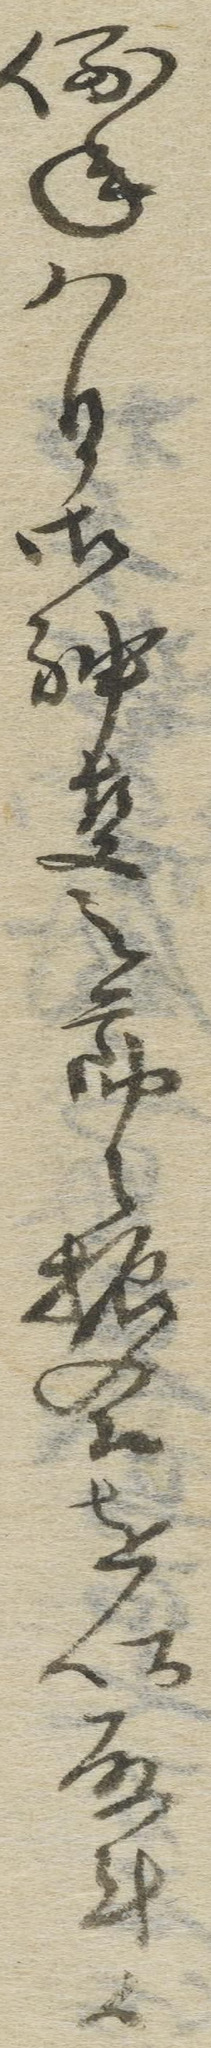例年八月御神事之節之振合を以取計候
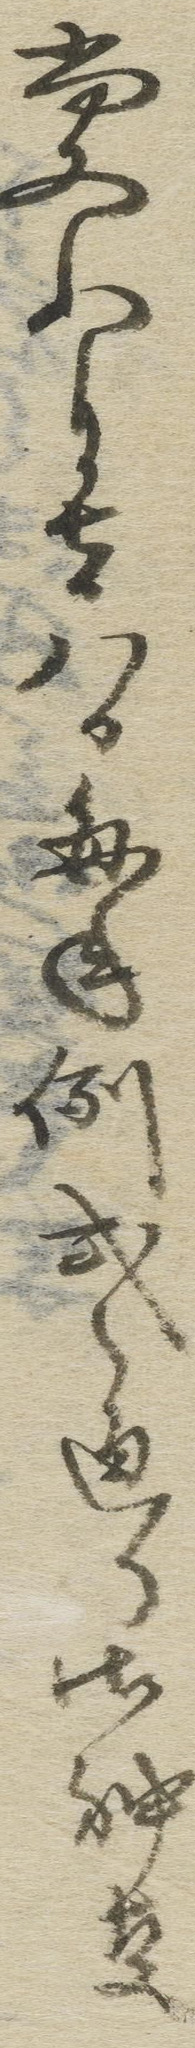尚又八月七日八日再年例式之通り御神事
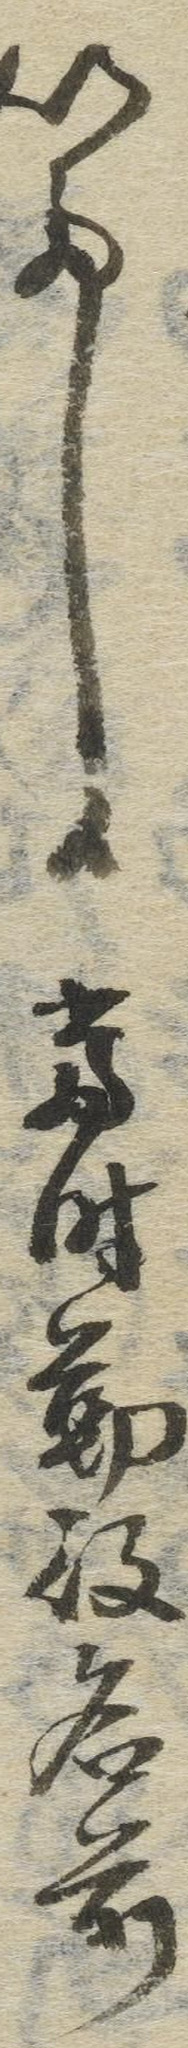いたし候当時勤役名前
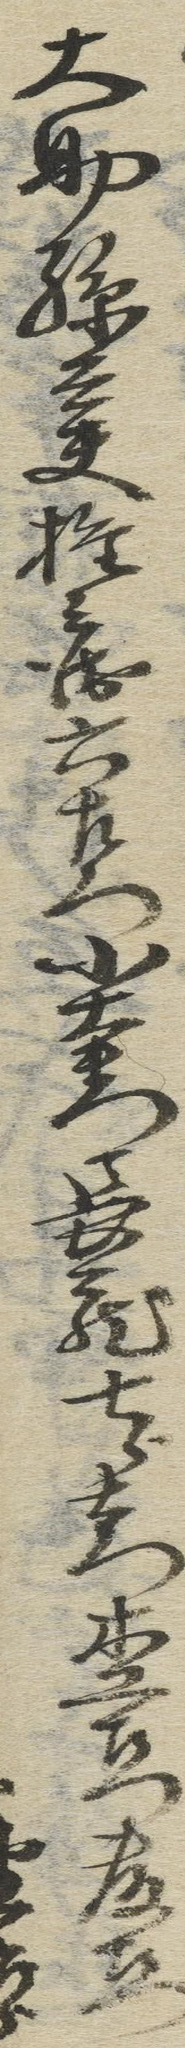大助孫太夫権兵衛六左衛門小右衛門長蔵七郎右衛門杢右衛門藤左衛門
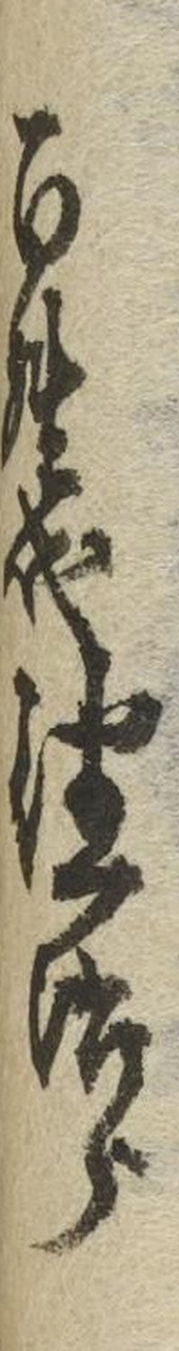百姓代潘治郎
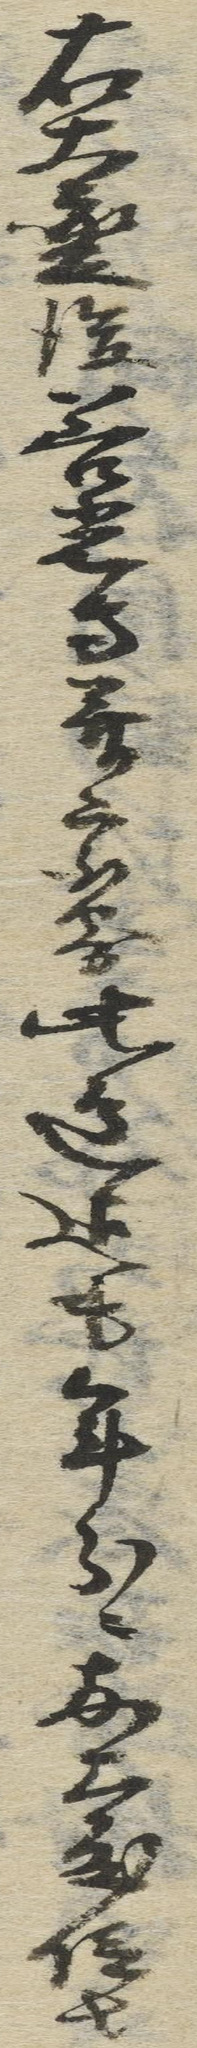右大変後善光寺并最寄此辺迄も年分二両三度位は
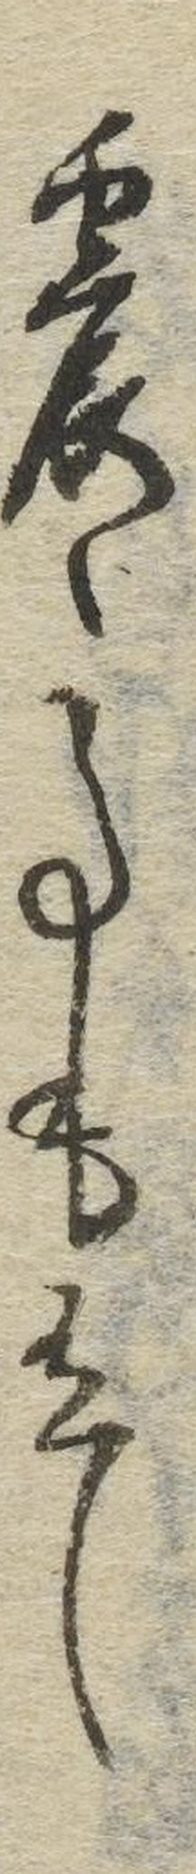震候事も有之
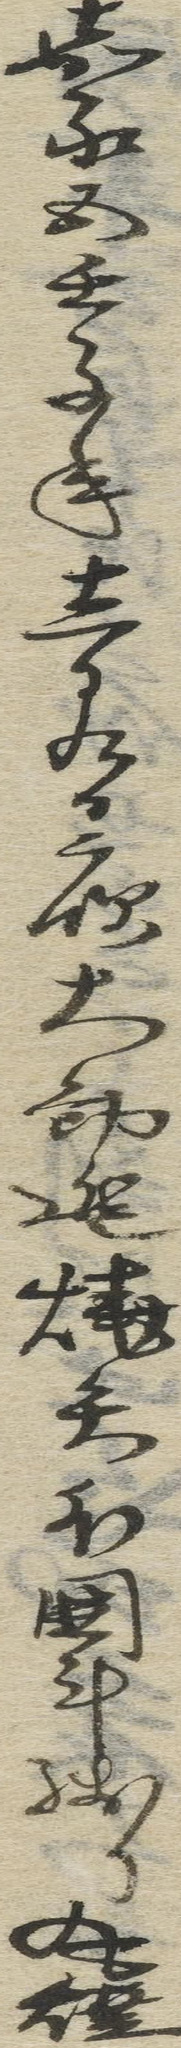嘉永五壬子年十二月九日夜大勧進焼失外囲斗残り丸焼
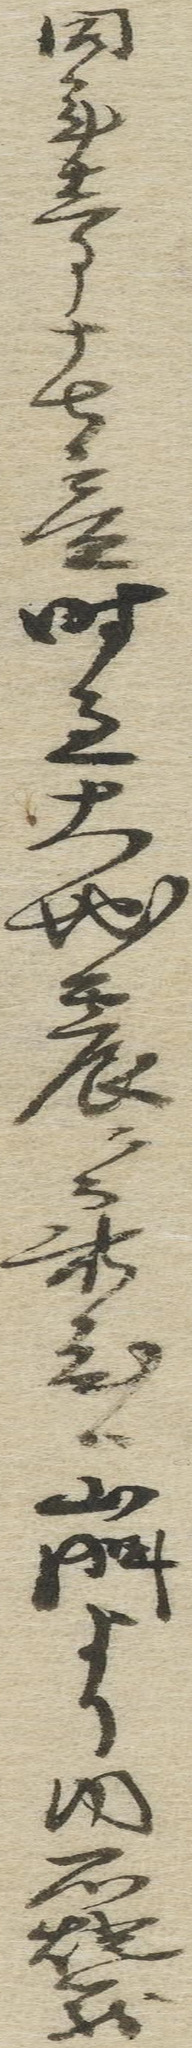同年十二月十七日昼時過大地震二而此度ハ山門より内石燈籠
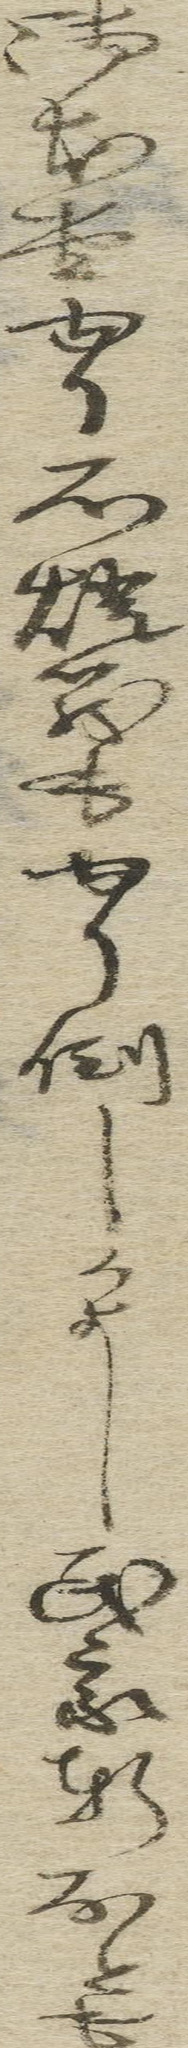御本堂ゆり石燈籠もゆり倒し候よし民家軒なとも
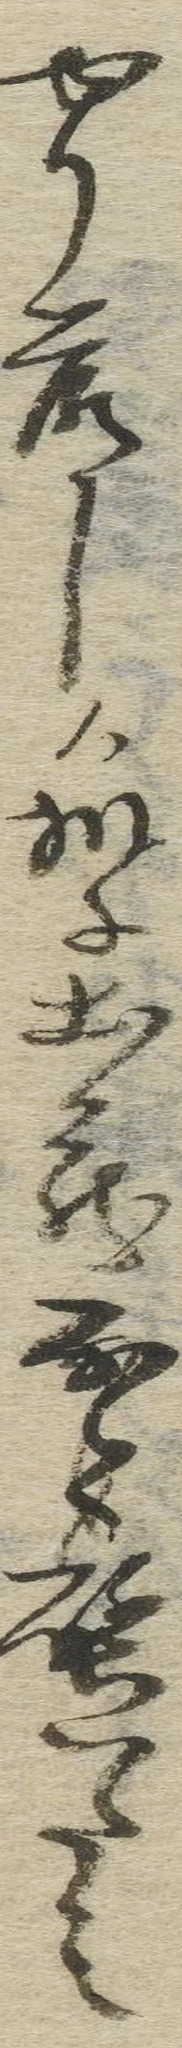ゆり落し候様子土蔵なと壁いたミ候
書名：信濃越後　地震書留
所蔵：東京大学地震研究所図書室 Earthquake Research Institute Library, The University of Tokyo, JAPAN
